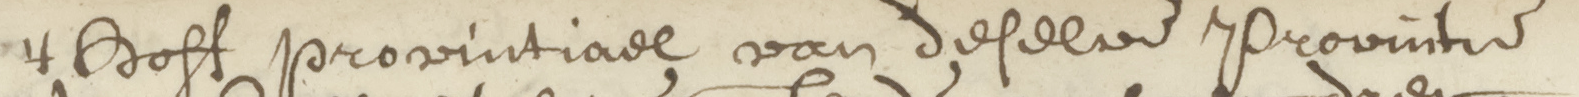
‛t Hoff provintiael van deselve Provintie
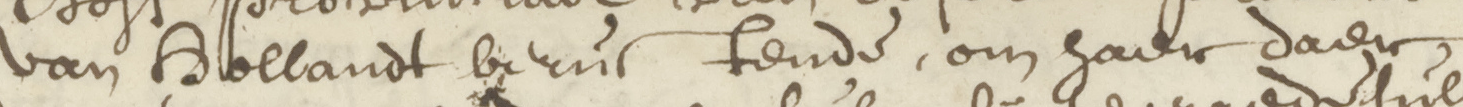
van Hollandt berustende, om haer daer
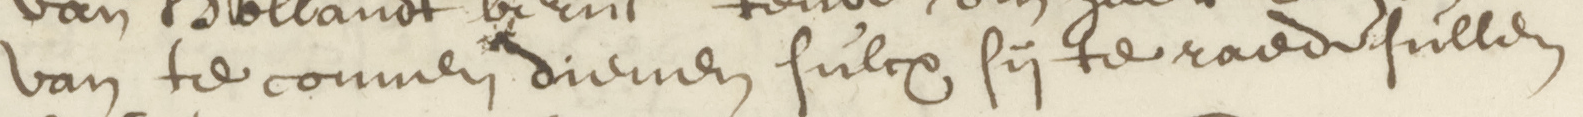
van te connen dienen sulcx sij te raede sullen
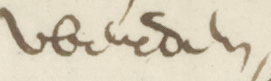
werden.
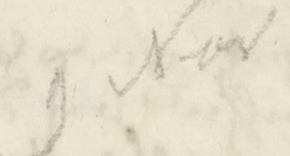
9 Nov.
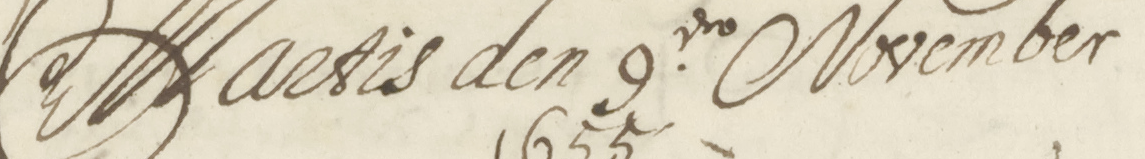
Martis den 9en. November
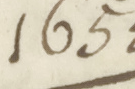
1655.
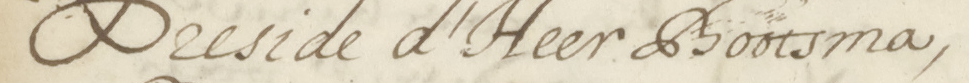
Preside d‛Heer Bootsma,
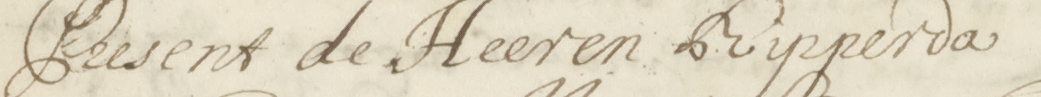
Present de Heeren Ripperda
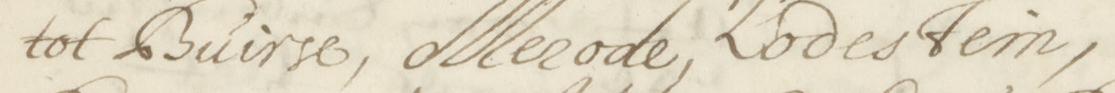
tot Buirse, Merode, Lodestein,
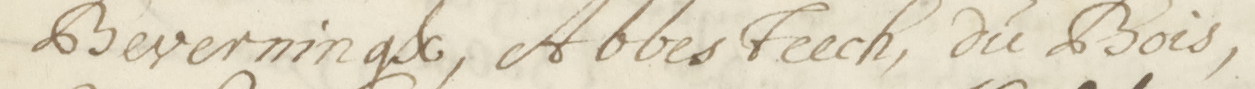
Beverningk, Abbesteech, du Bois,
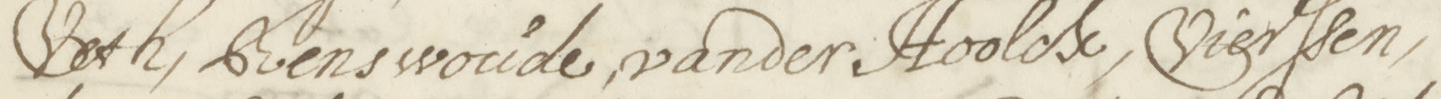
Veth, Renswoude, vander Hoolck, Vierssen,
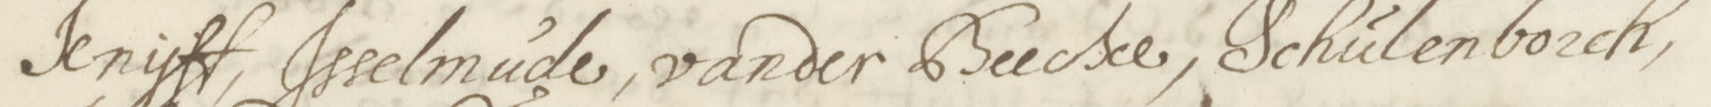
Knijff, Isselmude, van der Beecke, Schulenborch,
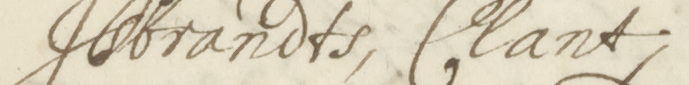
Isbrandts, Clant.
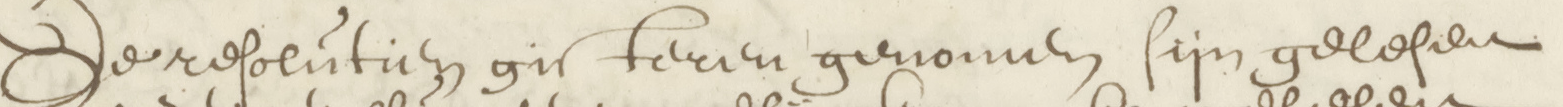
De resolutien gisteren genomen sijn gelesen
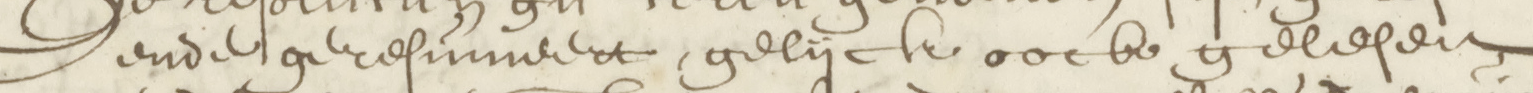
ende geresumeert, gelijck oock gelesen
